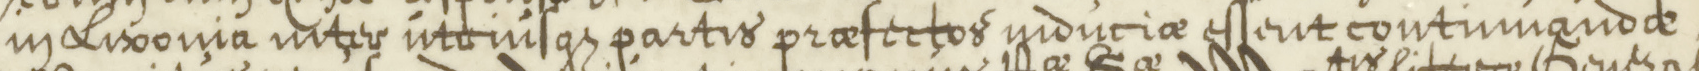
in Livonia inter utriusque partis præfectos induciæ essent continuandæ
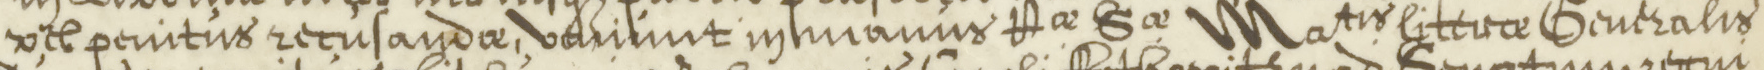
vel penitus recusandæ, veniunt in manus Ræ. Sæ. Matis litteræ Generalis
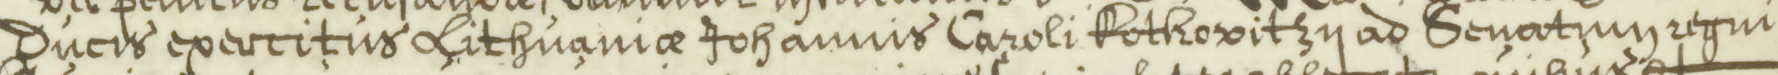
Ducis exercitus Lithuaniæ Johannis Caroli Rothovitzy ad Senatum regni
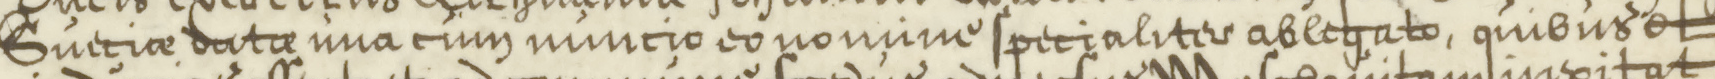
Sueciæ datæ una cum nuncio eo nomine specialiter ablegato, quibus et
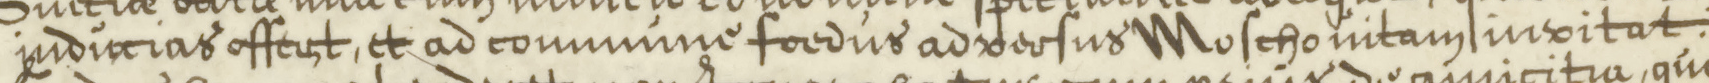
inducias offert, et ad commune foedus adversus Moschouitam invitat:
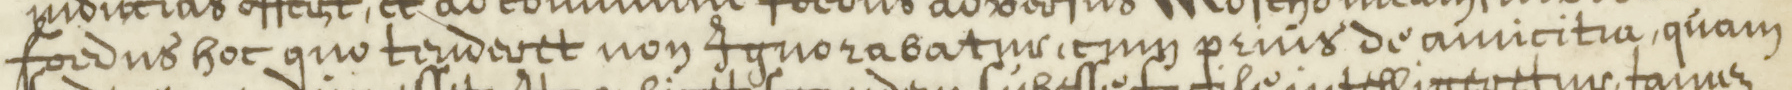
foedus hoc quo tenderet non Ignorabatur, cum prius de amicitia, quam
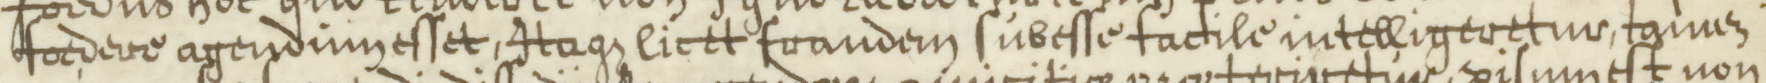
foedere agendum esset, Itaque licet fraudem subesse facile intelligeretur, tamen
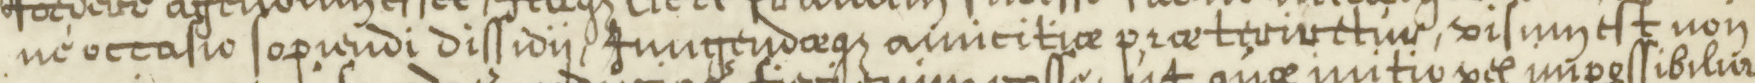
ne occasio sopiendi dissidii, Iungendæque amicitiæ præteriretur, visum est non
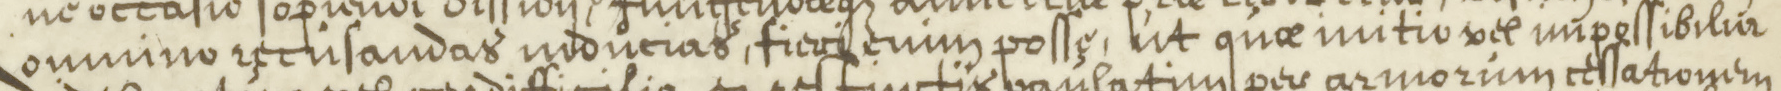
omnino recusandas inducias, fieri enim posse, ut quæ initio vel impossibilia
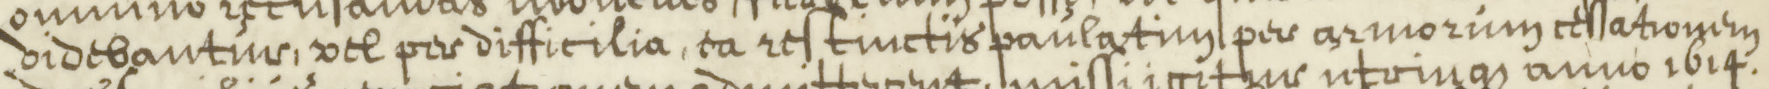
videbantur, vel per difficilia, ea restinctis paulatim per armorum cessationem
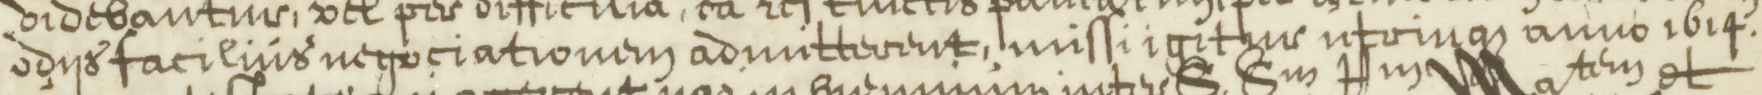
odiis facilius negociationem admitterent, missi igitur utrinque anno 1614.
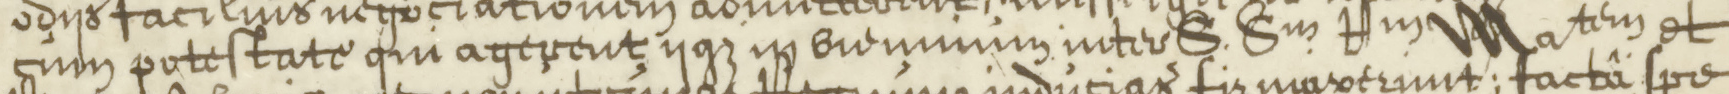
cum potestate qui agerent, iique in biennium inter S. Sm. Rm. Matem et
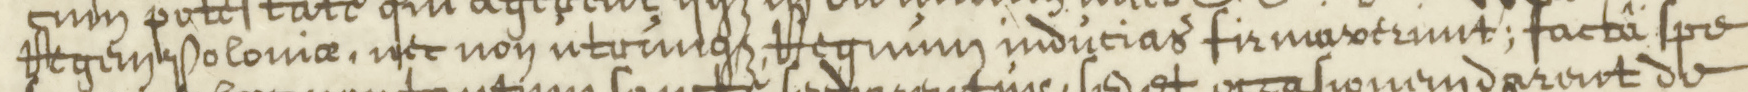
Regem Poloniæ, nec non utrumque Regnum inducias firmaverunt; facta spe
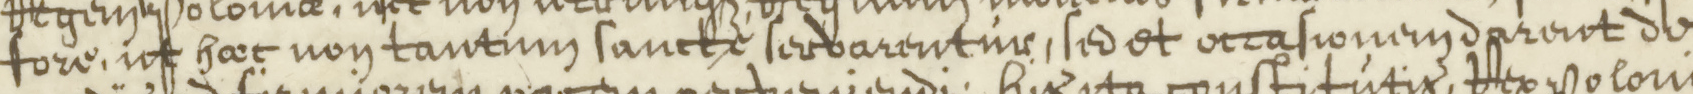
fore, ut hæc non tantum sancte servarentur, sed et occasionem darent de
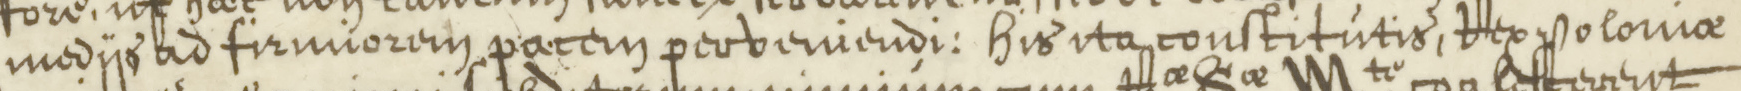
mediis ad firmiorem pacem perveniendi: his ita constitutis, Rex Poloniæ
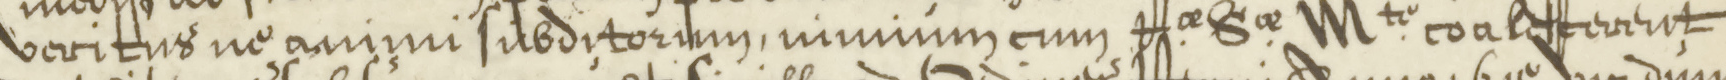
veritus ne animi subditorum, nimium cum Ræ. Sæ. Mte. coalescerent
